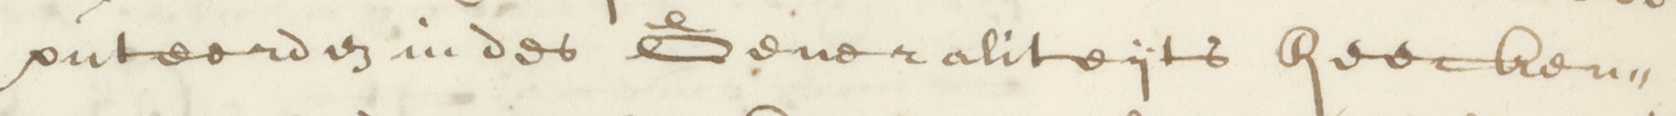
puteerden in des Generaliteijts Reecken„
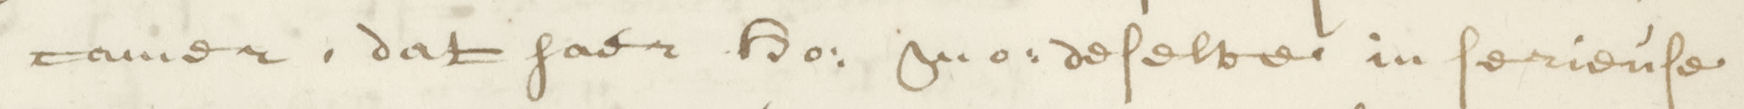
camer, dat haer Ho:Mo: deselve in serieuse
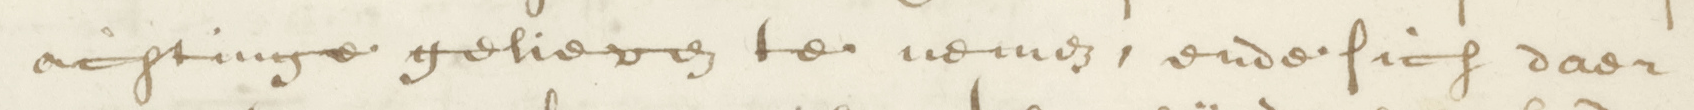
achtinge gelieven te nemen, ende sich daer
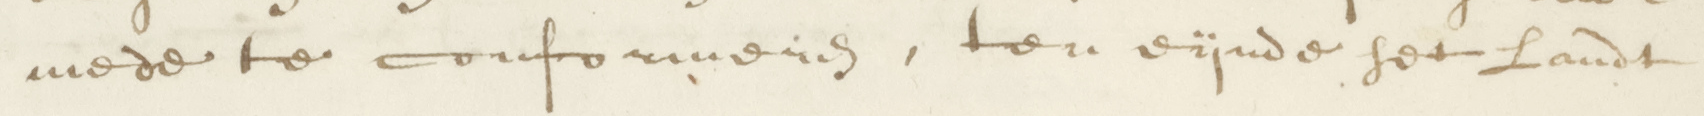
mede te conformeren, ten eijnde het Landt
